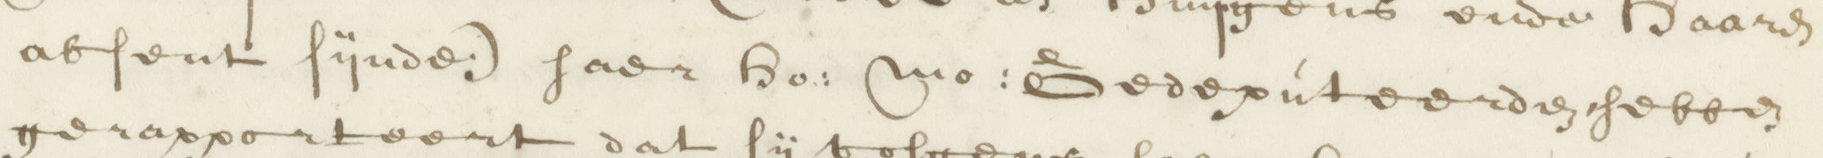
absent sijnde) haer Ho:Mo: Gedeputeerden hebben
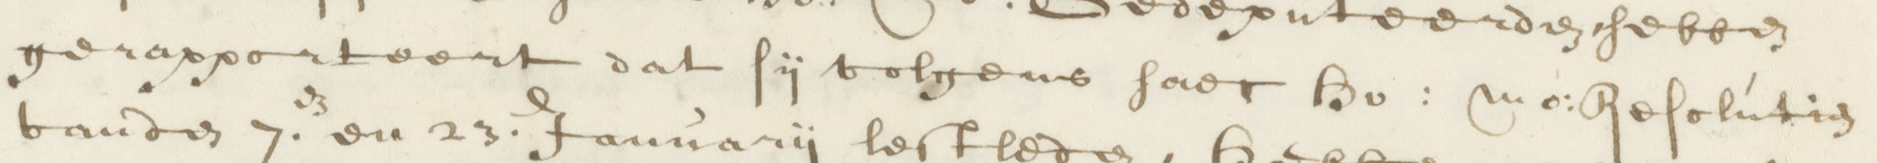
gerapporteert dat sij volgens haer Ho:Mo: Resolutien
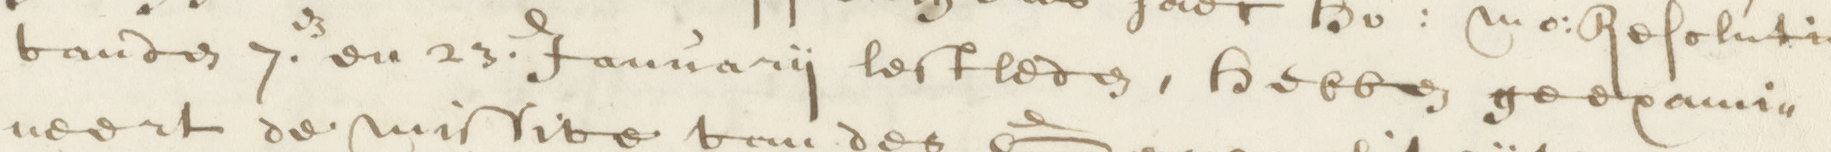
vanden 7en. en 23. Januarij lestleden, hebben geexami„
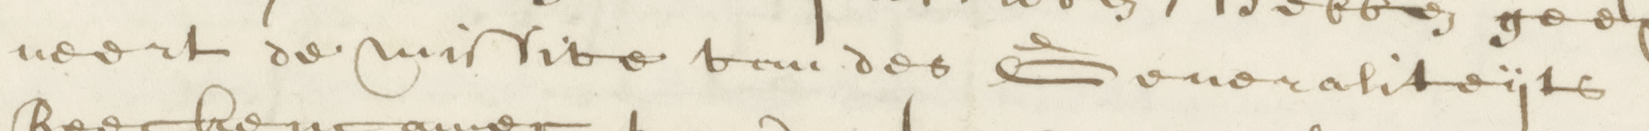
neert de missive van des Generaliteijts
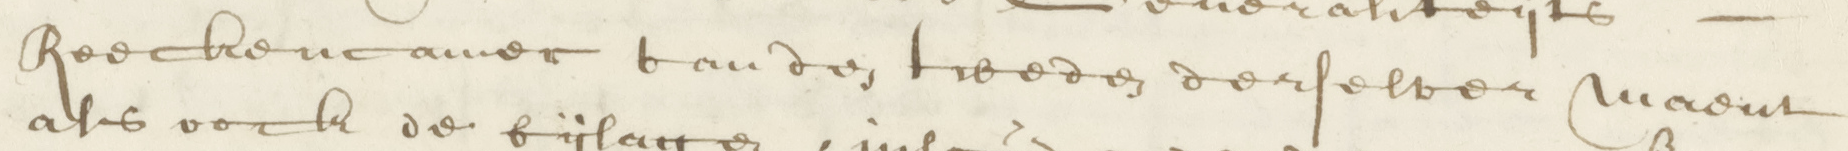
Reeckencamer van den tweden derselver maent
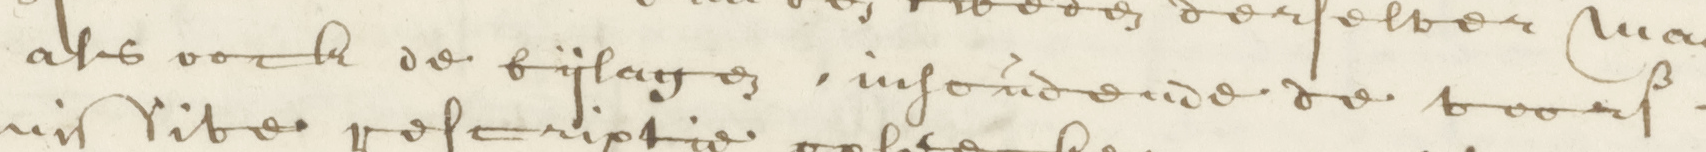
als oock de bijlagen, inhoudende de voors
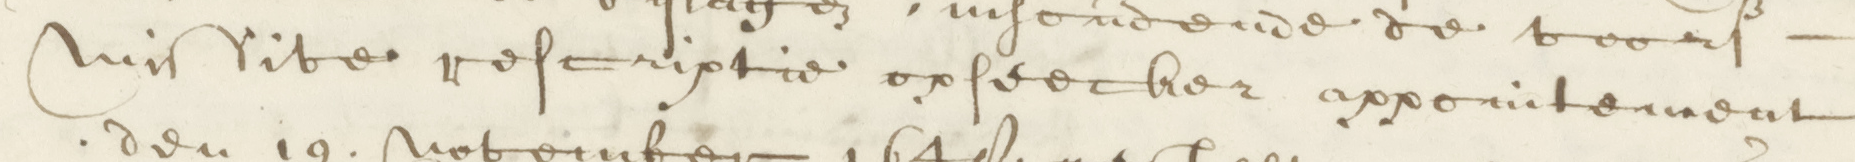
Missive rescriptie op seecker appointement
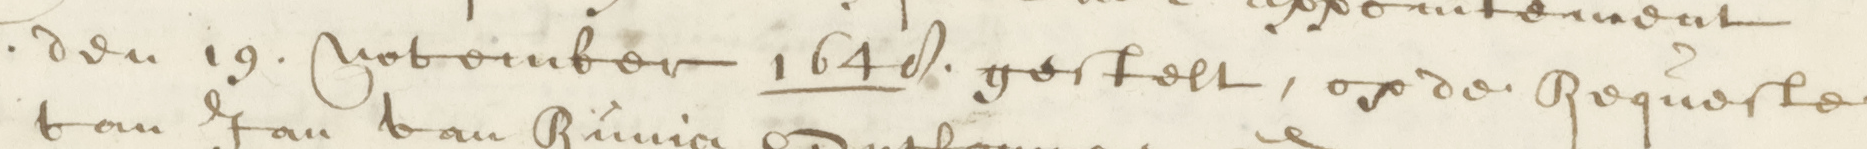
den 19. November 1648. gestelt, op de Requeste
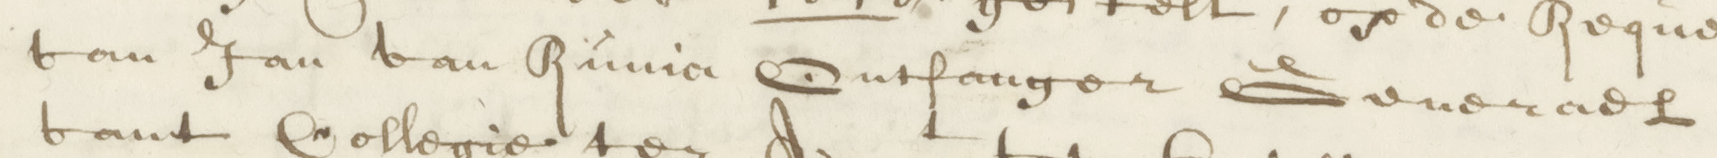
van Jan van Runia Ontfanger Generael
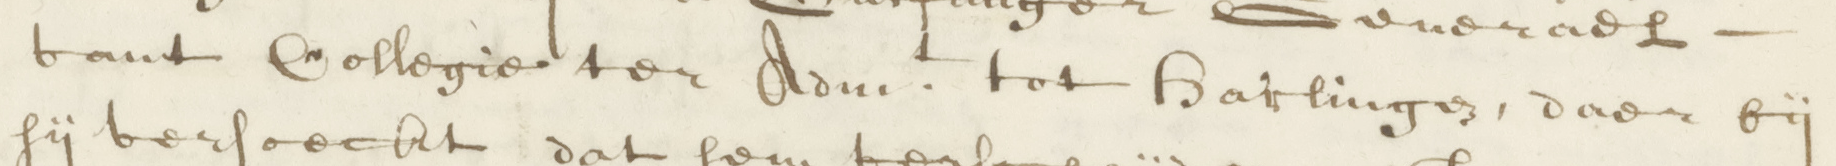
vant Collegie ter Admt. tot Harlingen, daer bij
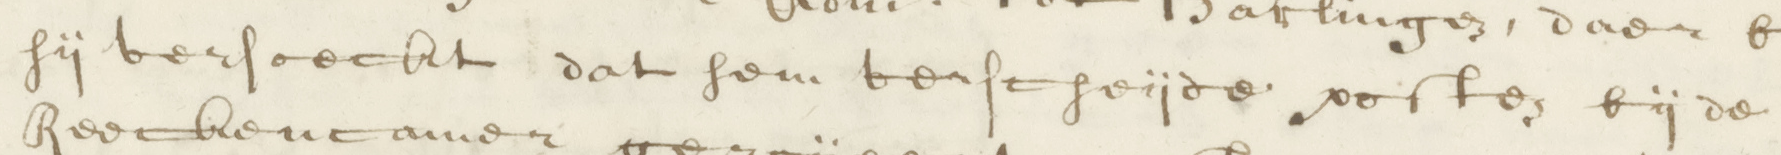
hij versoeckt dat hem verscheijde posten bij de
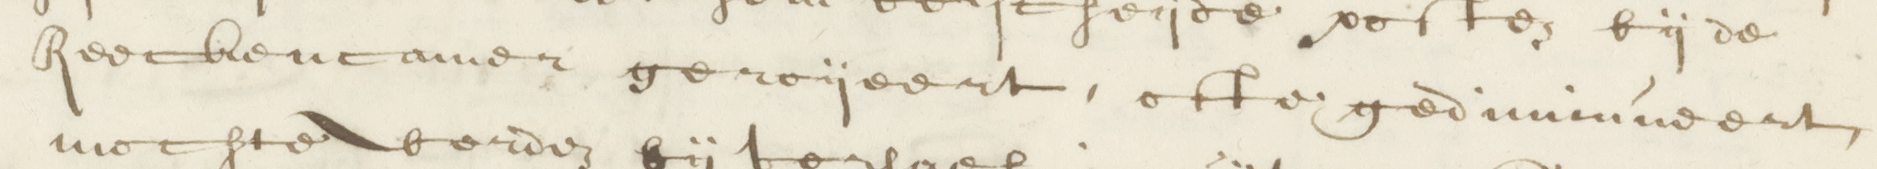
Reeckencamer geroijeert, ofte gediminueert,
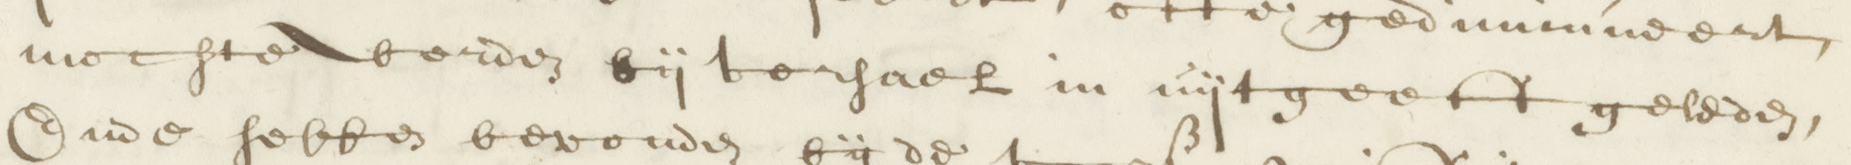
mochte werden bij verhael in uijtgeeff geleden.
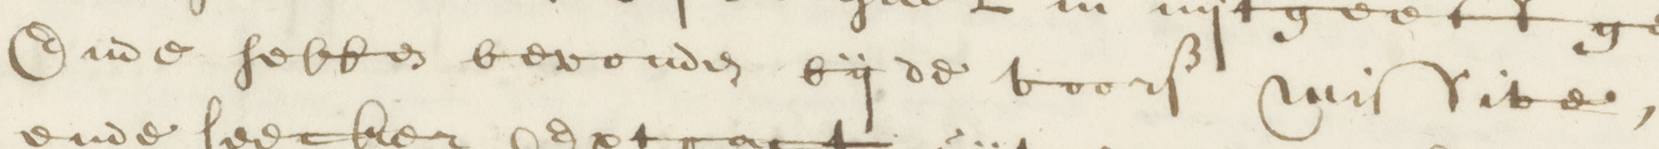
Ende hebben bevonden bij de voors missive,
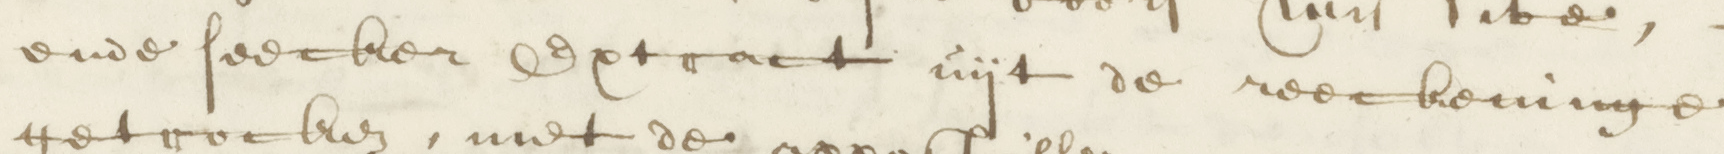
ende seecker Extract uijt de reeckeninge
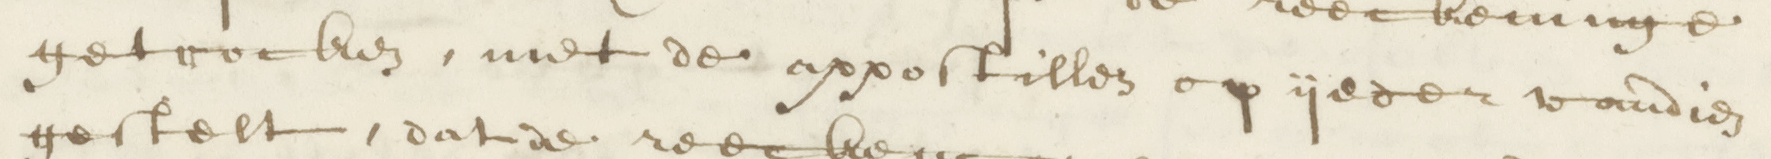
getrocken, met de appostillen op ijeder vandien
